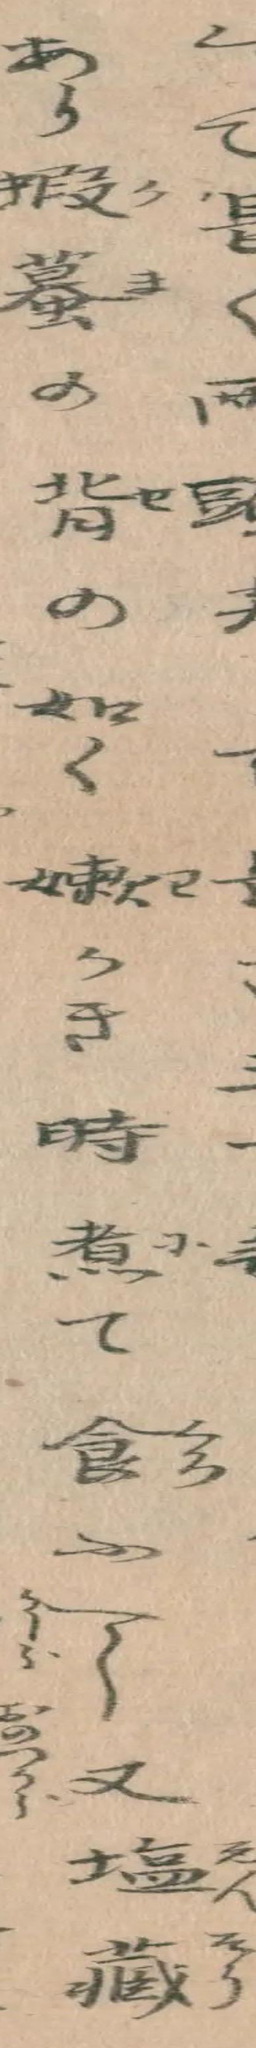あり蝦蟇の背の如く嫩かき時煮て食ふへし又塩蔵
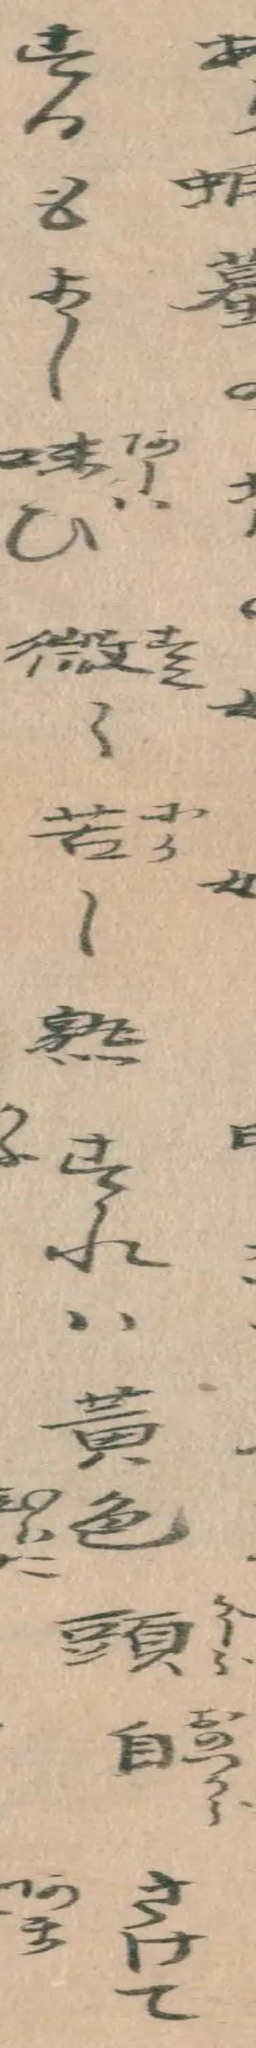するもよし味ひ微し苦し熟すれは黄色頭自さけて
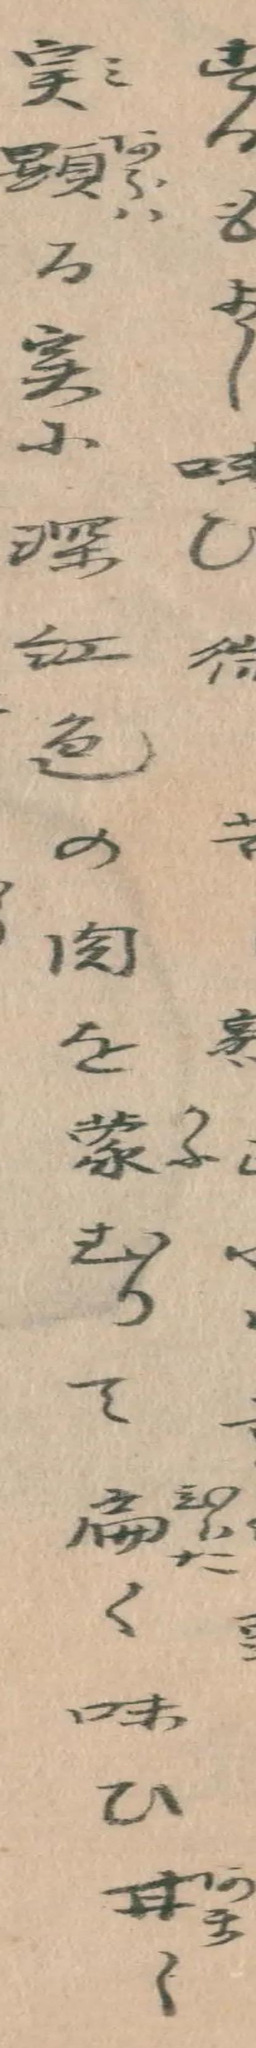実顕る実に深紅色の肉を蒙むりて扁く味ひ甘し
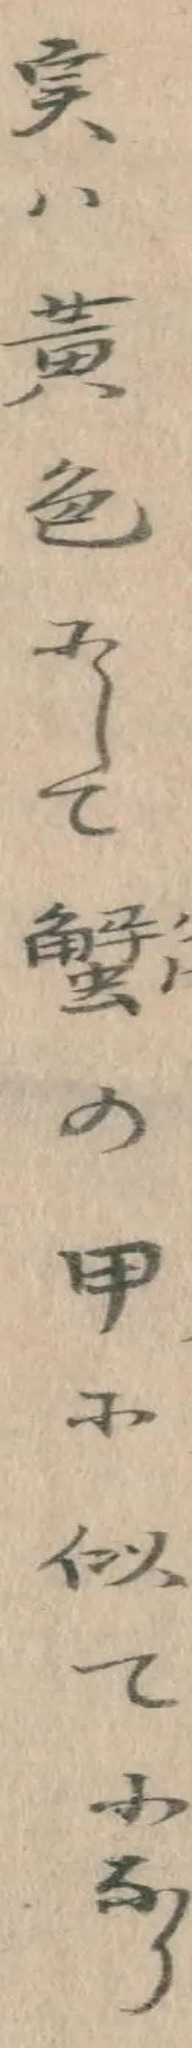実は黄色にして蟹の甲に似て小なり

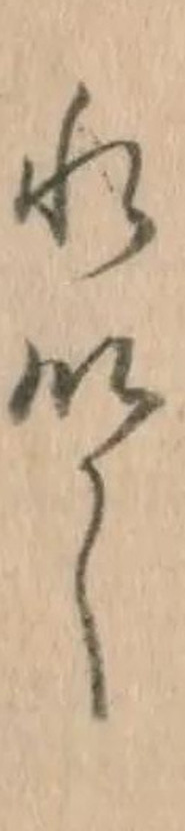れいし
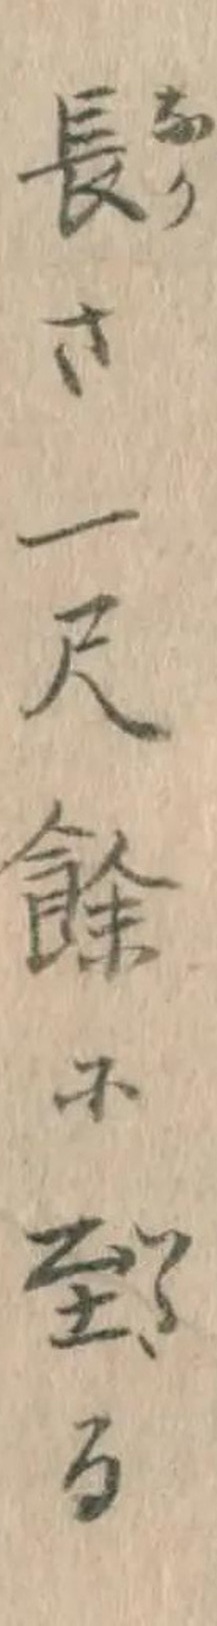長さ一尺余に至る

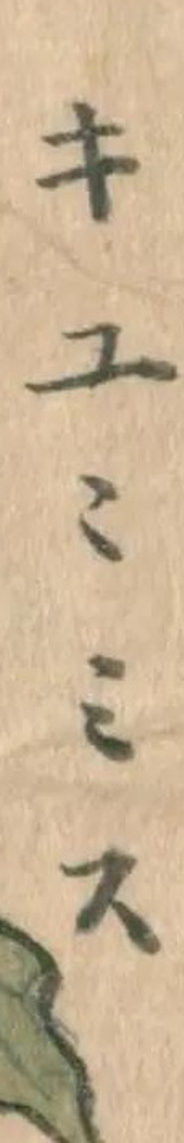キユ〻ミス
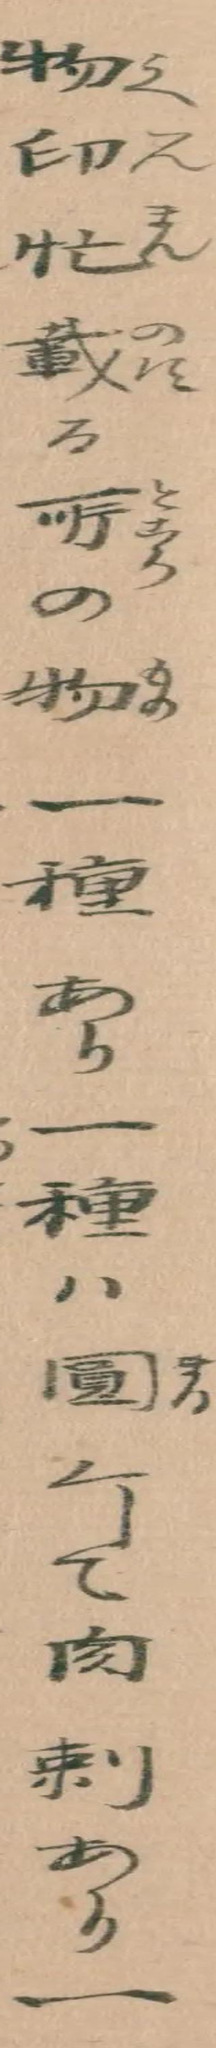物印忙載る所の物一種あり一種は円くして肉剌あり一
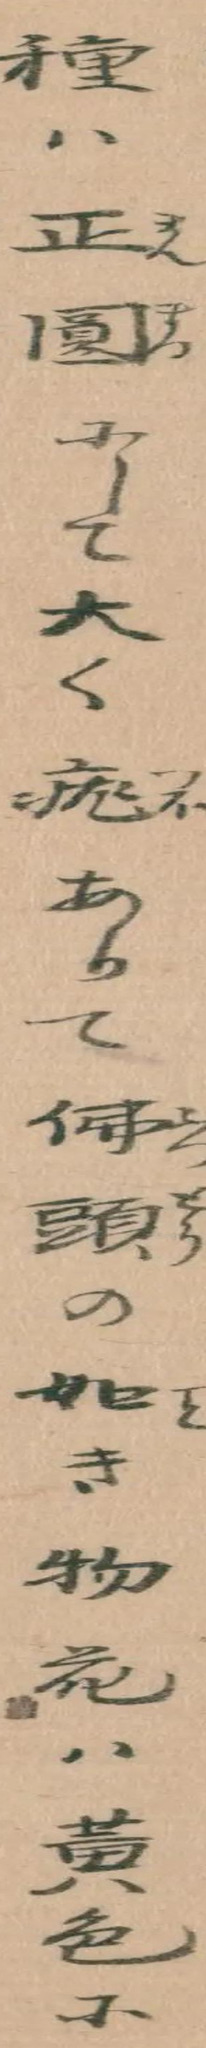種は正円にして大く疣ありて仏頭の如き物花は黄色に
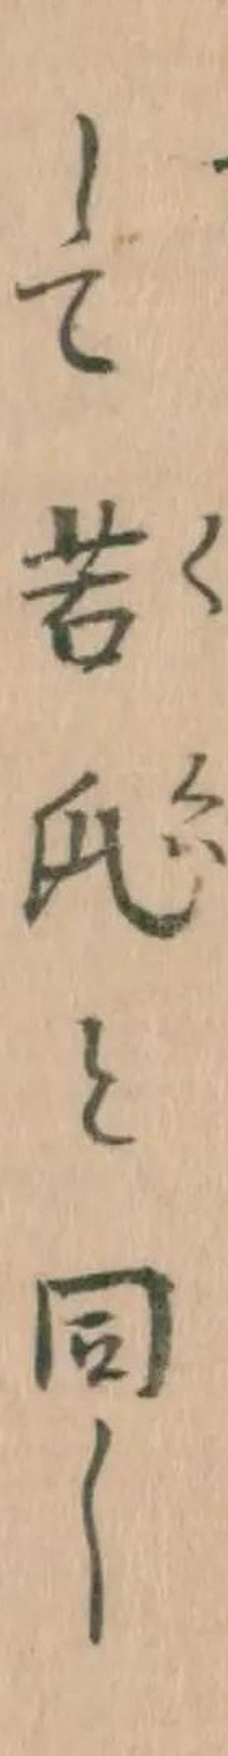して苦瓜と同し

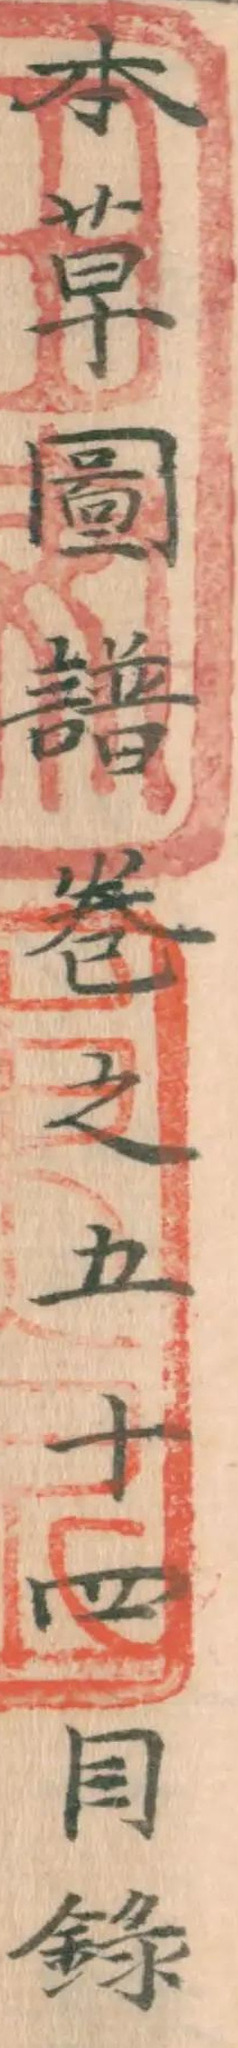本草図譜巻之五十四目録

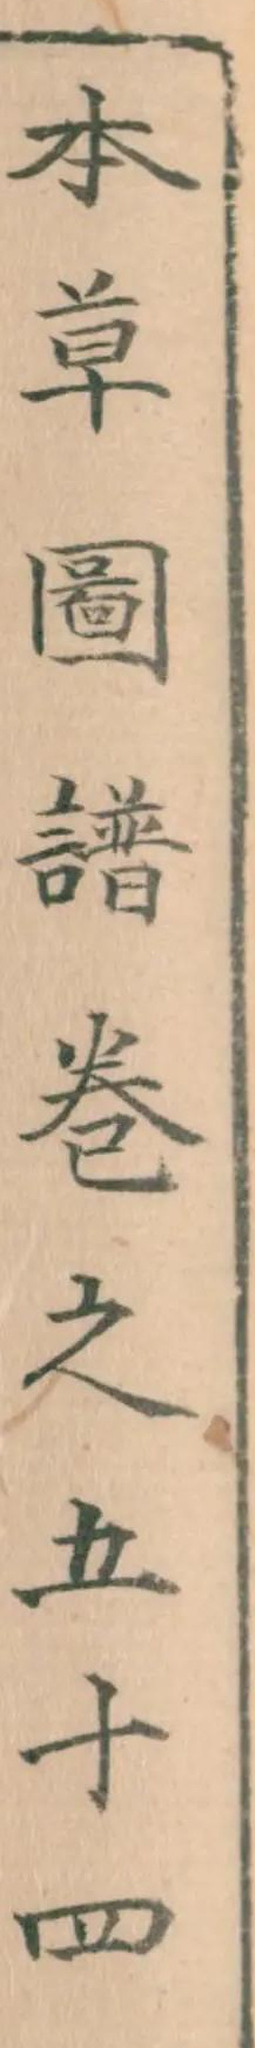本草図譜巻之五十四
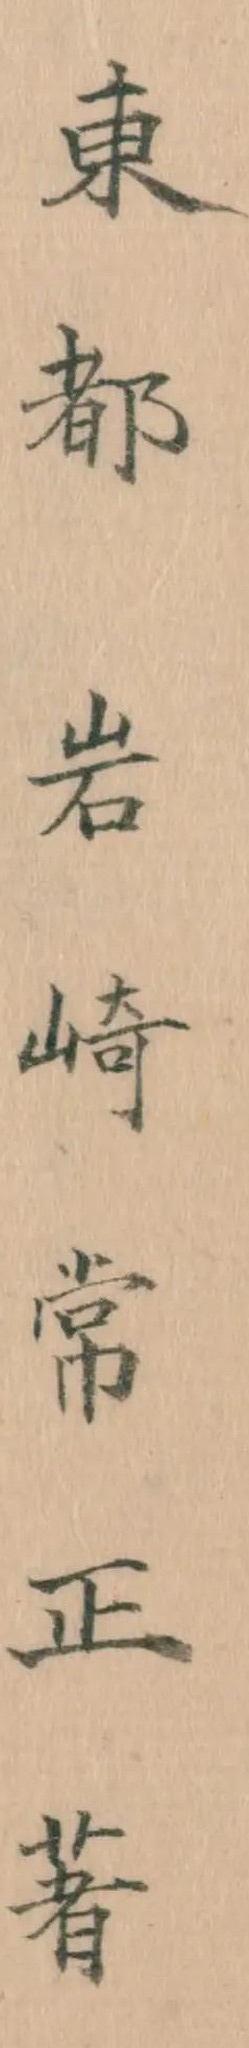東都岩崎常正著
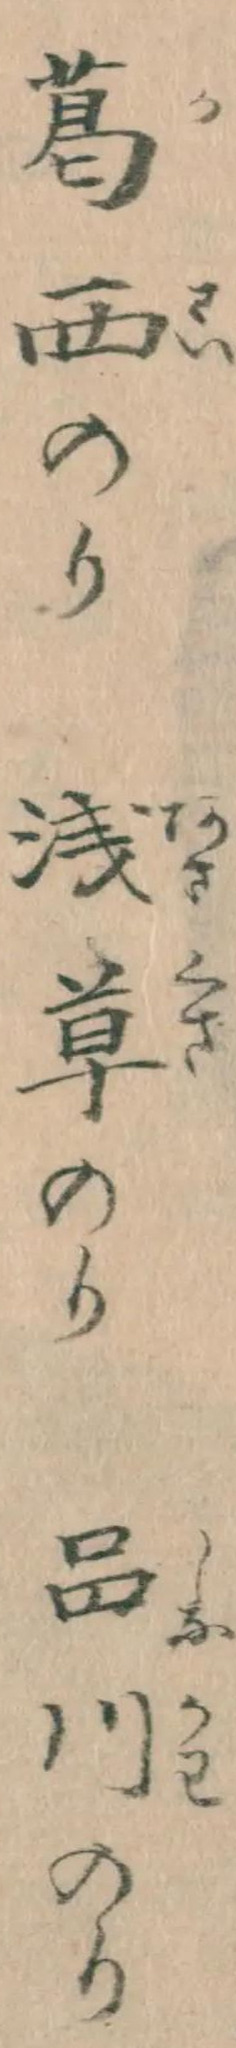葛西のり浅草のり品川のり
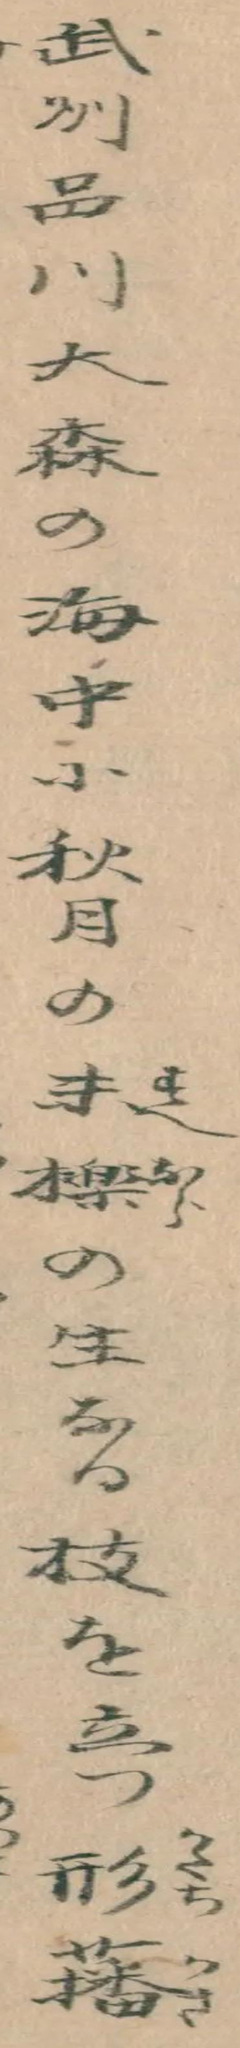武州品川大森の海中に秋月の末櫟の生なる枝を立つ形
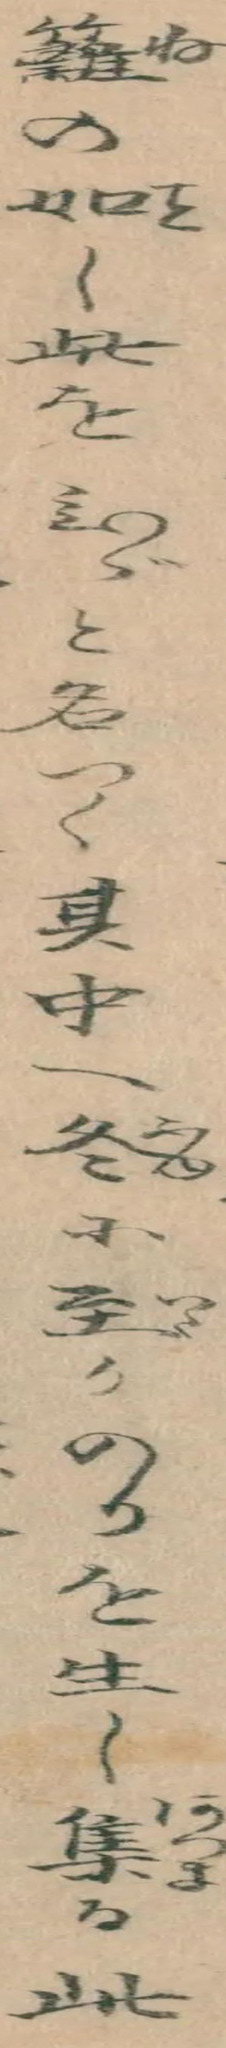籬の如し此をひゞと名つく其中へ冬に至りのりを生し集る此
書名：本草図譜. 巻52-54
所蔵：国立国会図書館 National Diet Library, JAPAN
